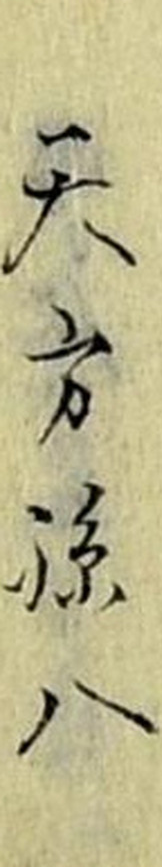天方孫八
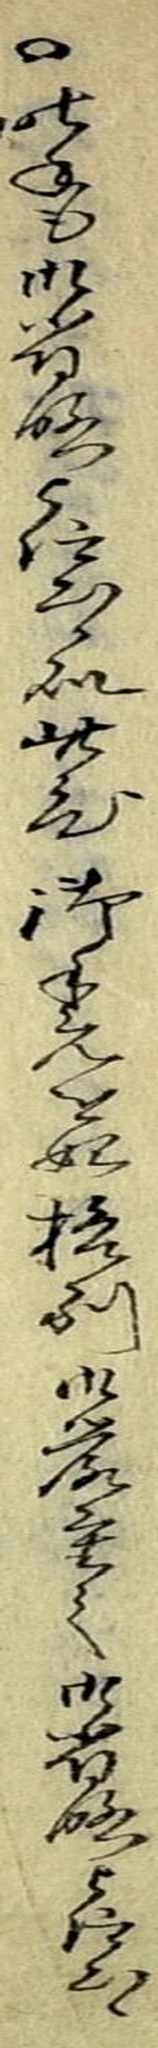○昨年も御省略被仰出候処此度御手元を始各別御厳重之御省略被仰出候
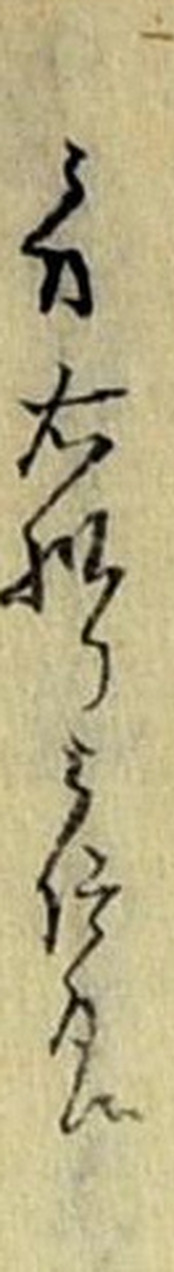に付右掛り被仰付候
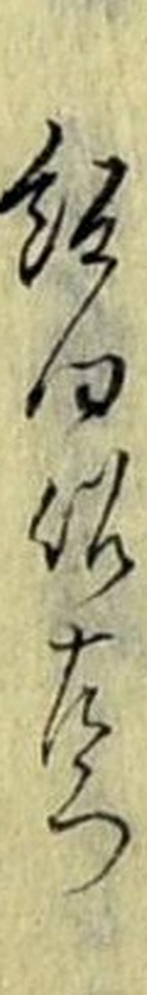飯田作左衛門
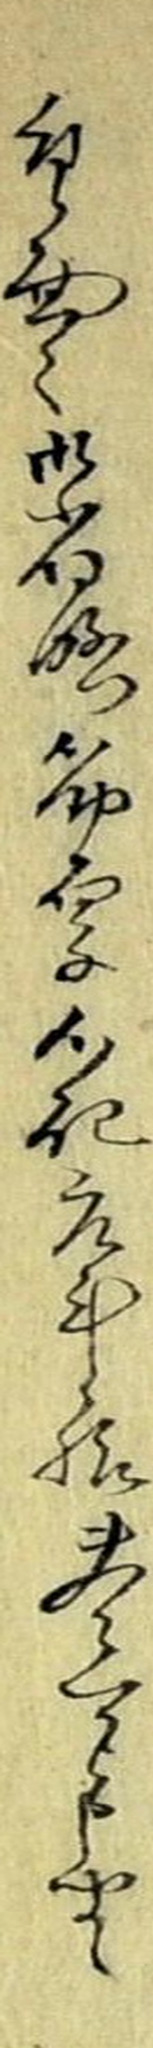付候面々へ御省略筋厚心配取斗候様夫々可被申聞候
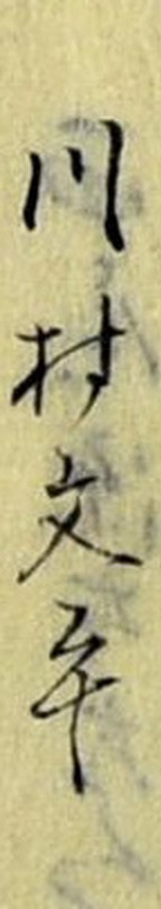川村文平

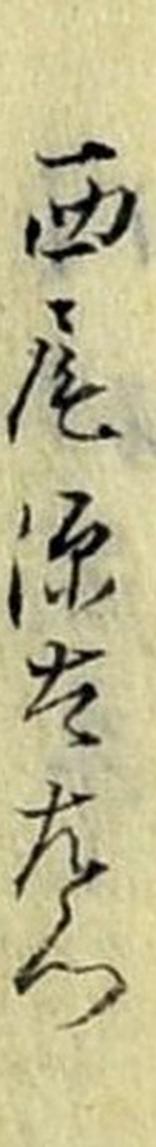西尾源太左衛門
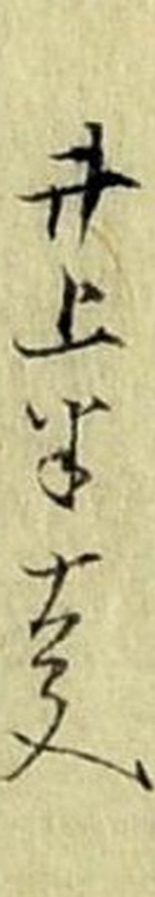井上半太夫
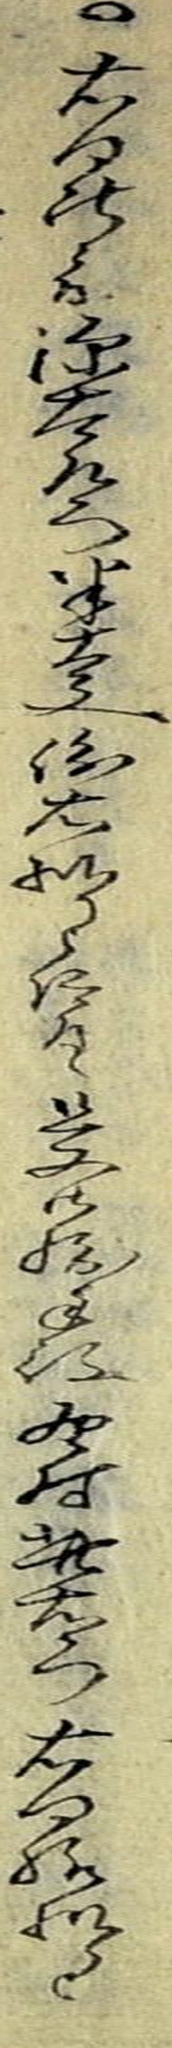○右同断に付源太左衛門半太夫儀右掛り被仰付候且又勝手役野村此右衛門右同様掛り被
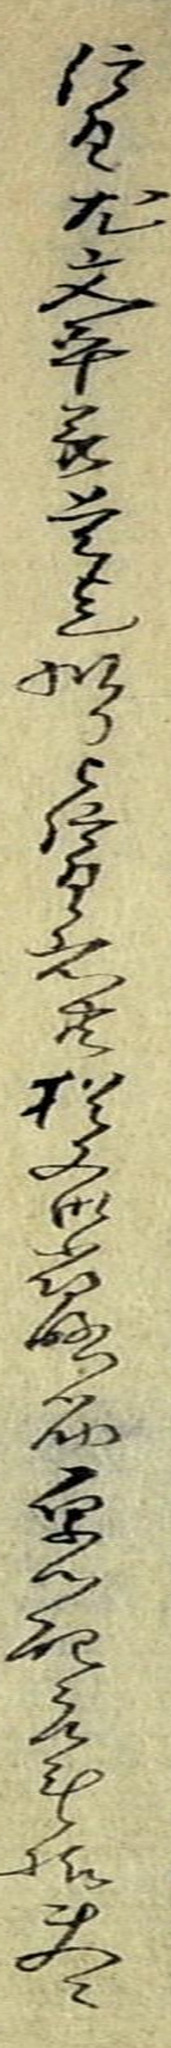仰付候尤文平并是迄掛り被仰付候者共猶又御省略筋厚心配取斗候様夫々
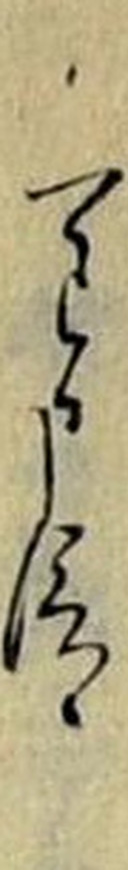可被申渡候
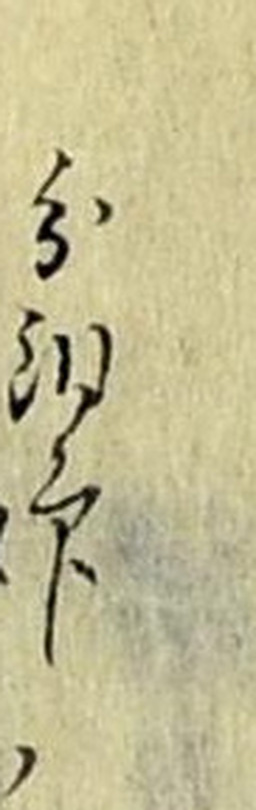分銅印
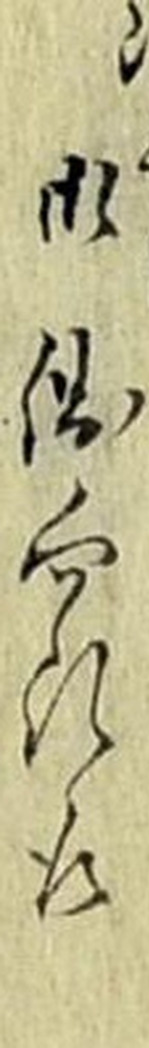御側向頭取
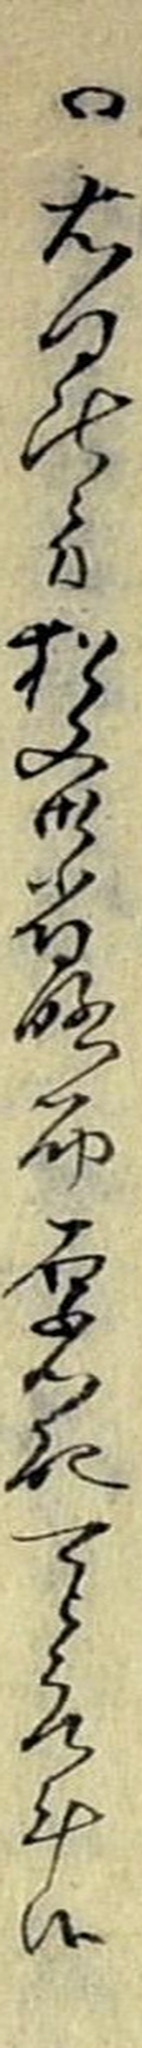○右同断に付猶又御省略筋厚心配可被取斗候
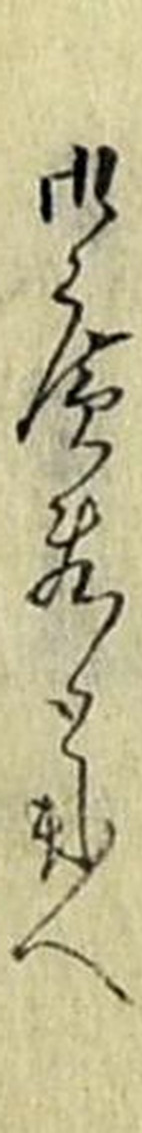御広敷御用人
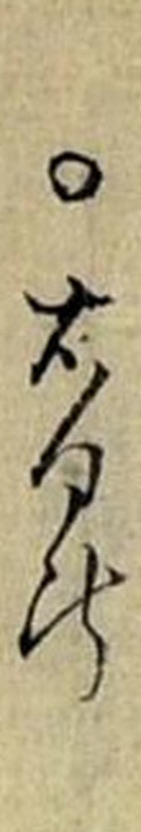○右同断
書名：命令之部 六
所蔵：福井県文書館 Fukui Prefectural Archives
